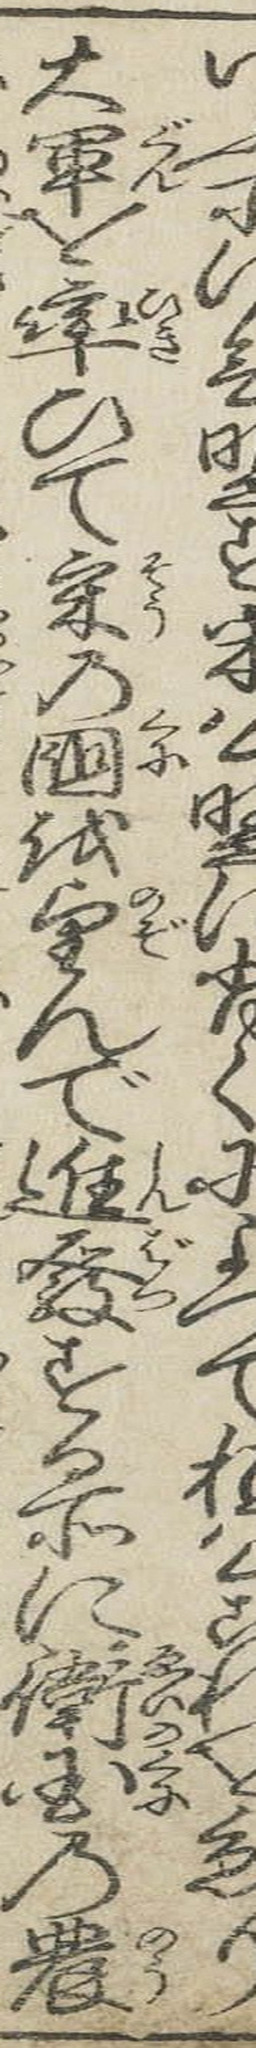大軍を率ひて宋の国を望んで進発する所に衛国の農
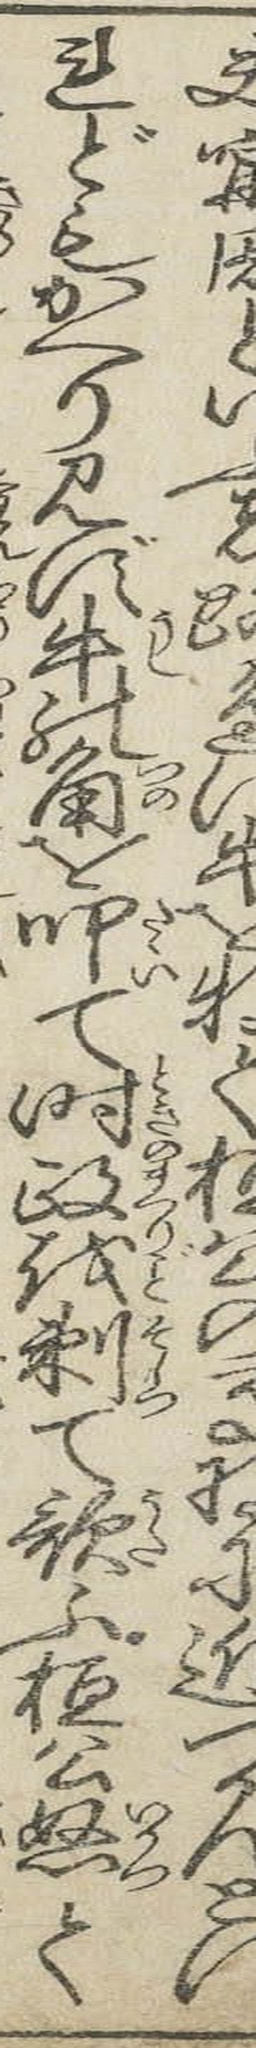れどもかへり見ず牛の角を叩て時政を刺て歌ふ。桓公怒て
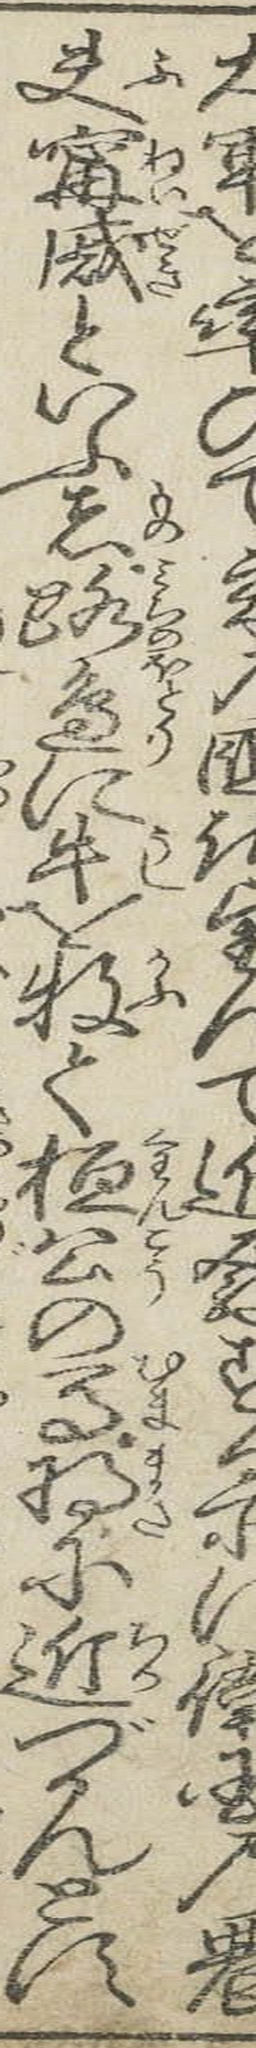夫甯戚といふ者。路辺に牛を牧て桓公の馬。牧に近づかんとす
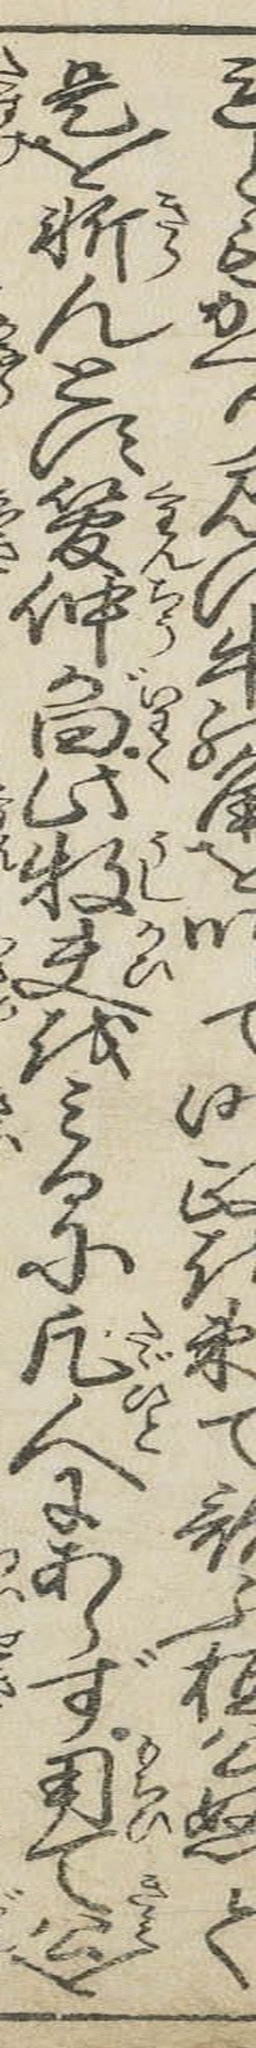是を斬んとす管仲が曰。此牧夫をみるに凡人にあらず。用て公を
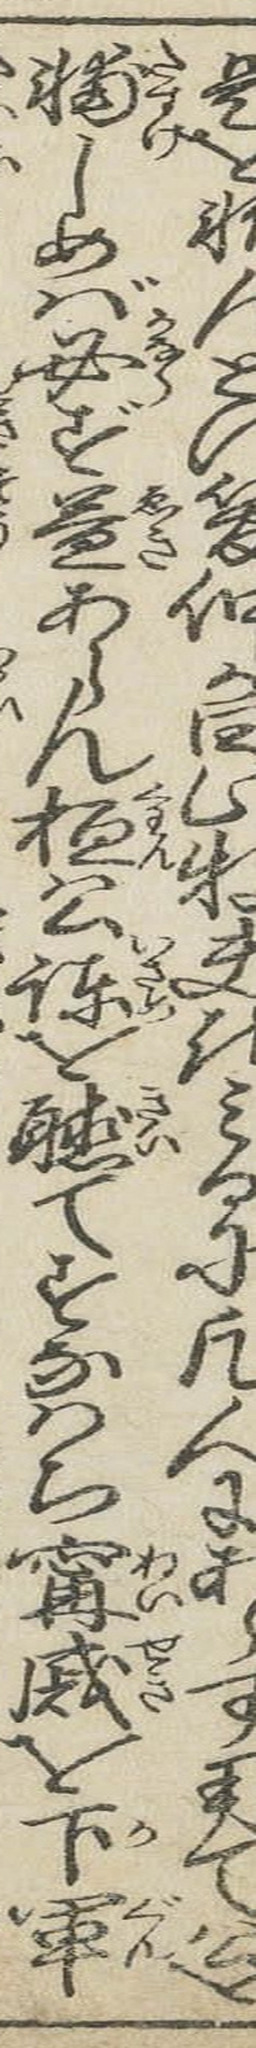輔しめば必ず益あらん桓公諫を聴てすなはち甯戚を下軍
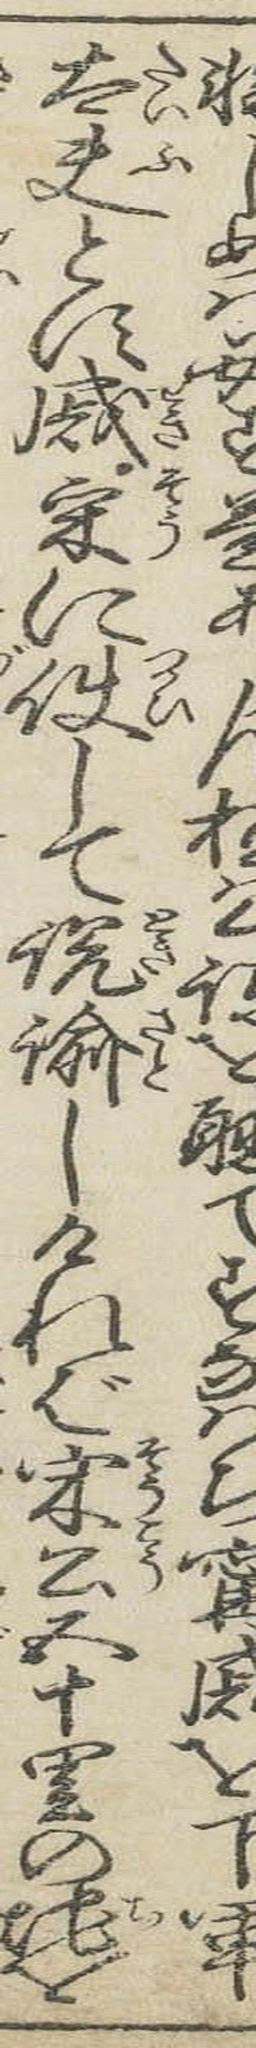太夫とす戚。宋に使して説諭しければ宋公五十里の地を
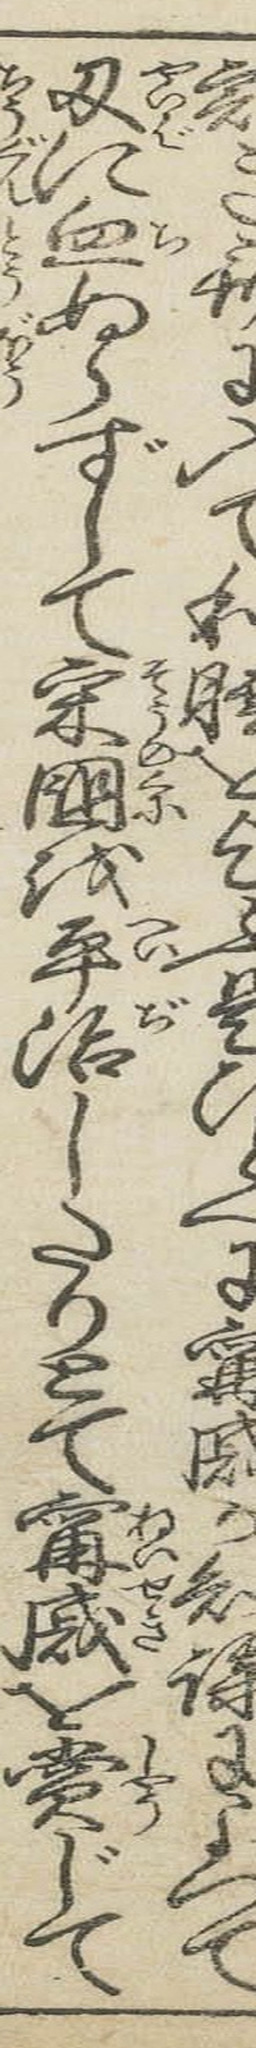刃に血ぬらずして宋国を平治したりとて甯戚を賞じて
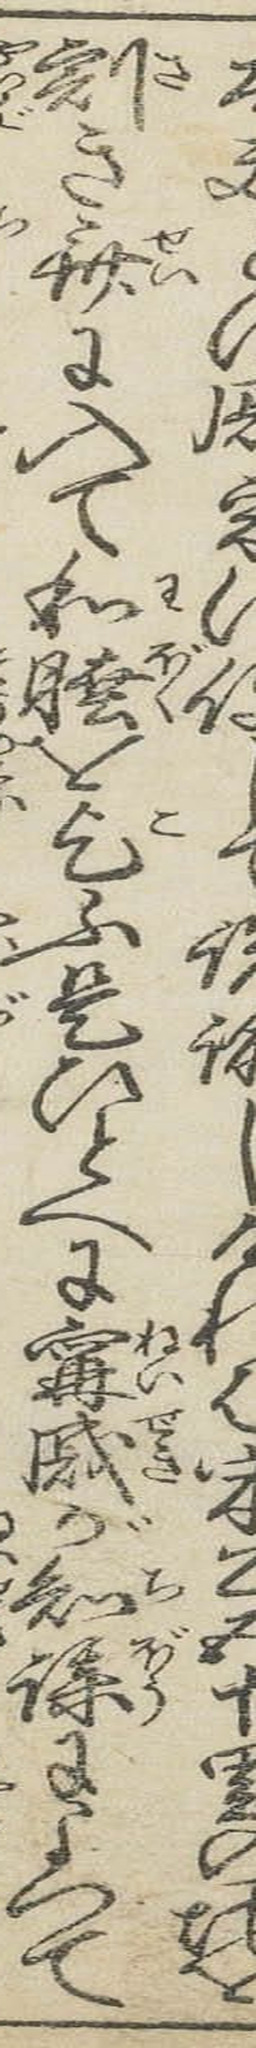割き斉に入て和睦を乞ふ是ひとへに甯戚が知謀によつて
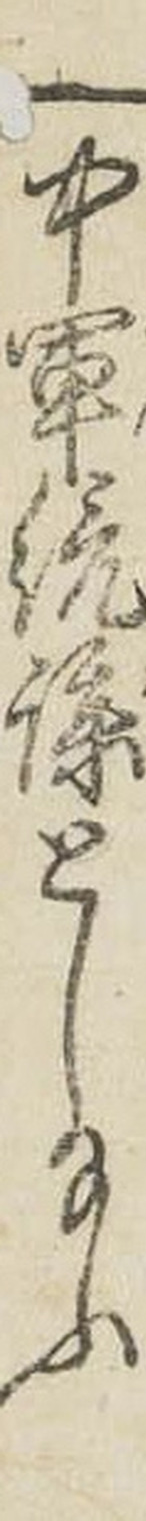中軍統謀とし給ふ
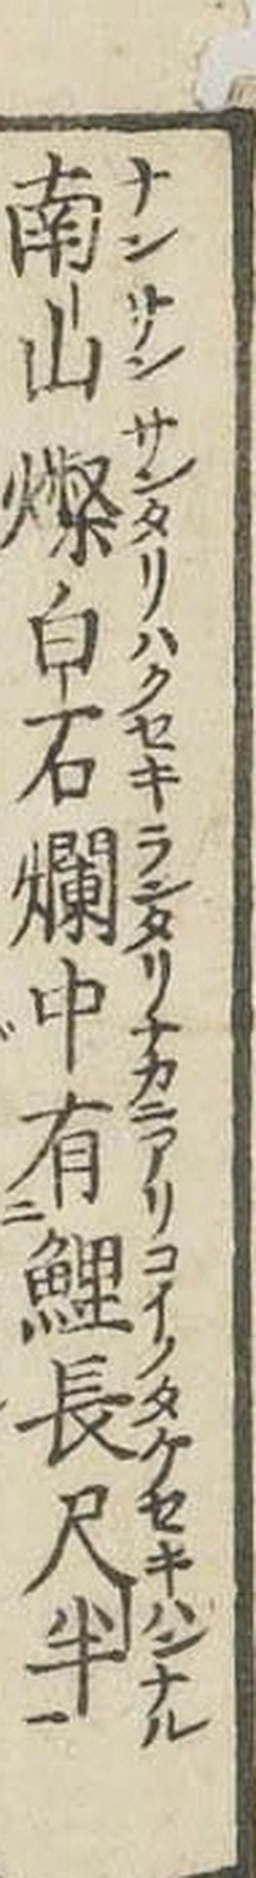南-山燦白-石爛中有鯉長尺-半

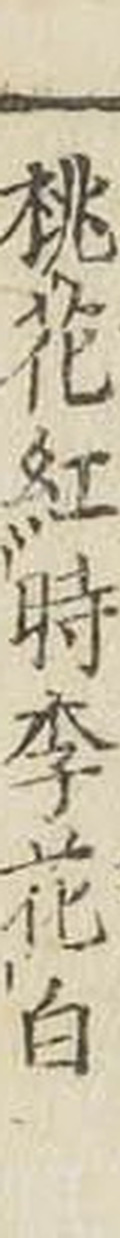桃花紅時李花-白
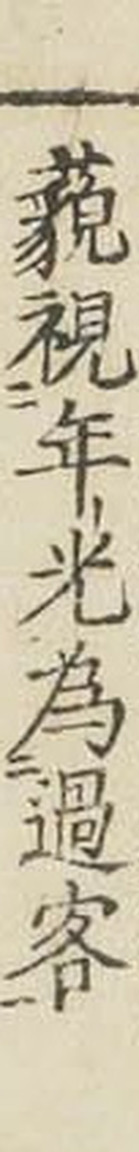藐視年-光為過客

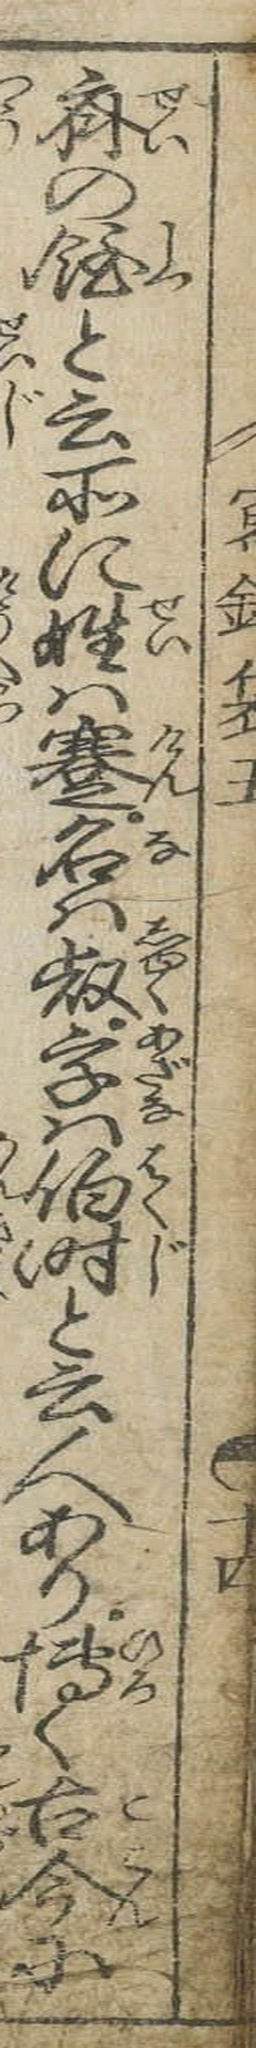斉の䬹と云所に姓は蹇。名は叔。字は伯時と云人あり。博く古今に
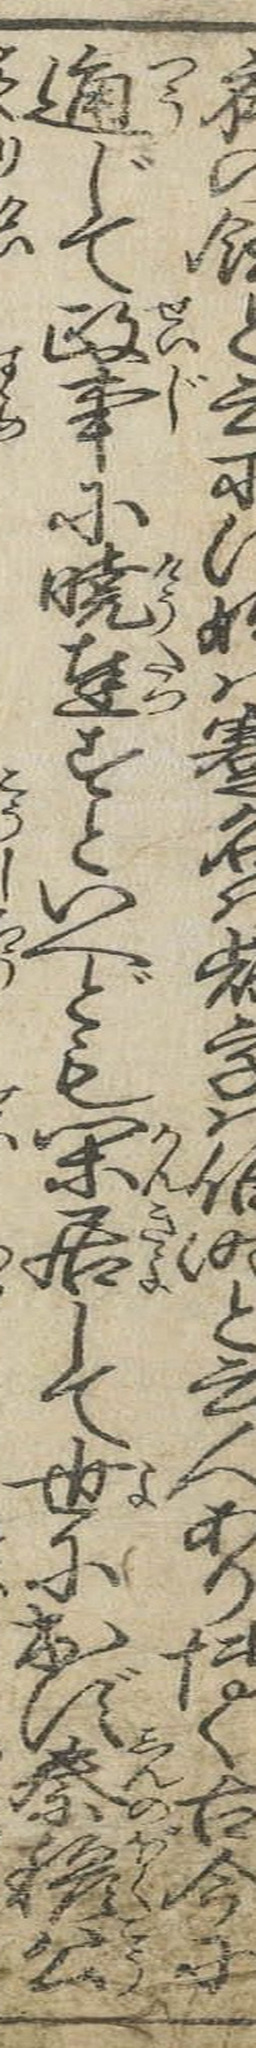通じて政事に暁達すといへども閑居して世に出ず秦穆公
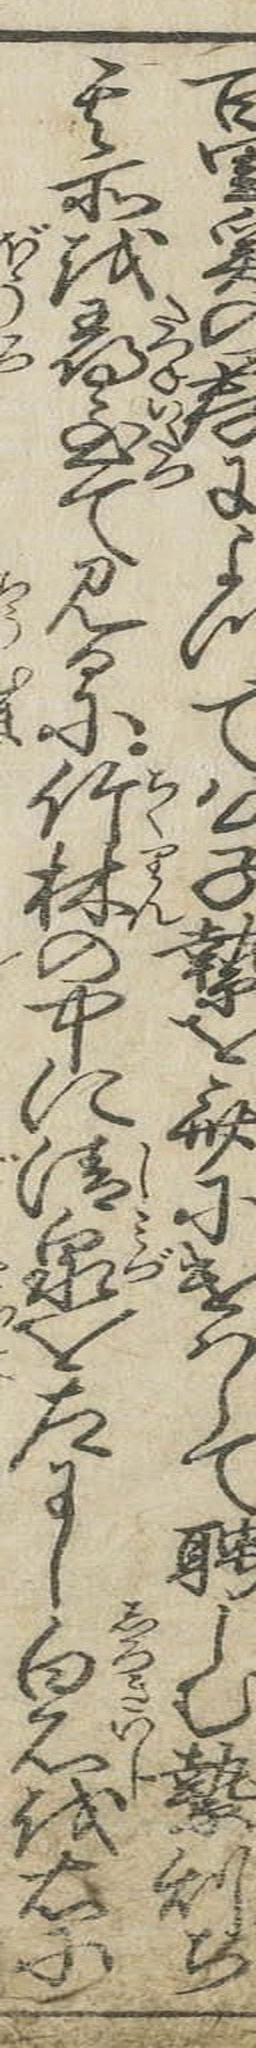其所を尋至て見るに。竹林の中に清泉を左にし白石を右に
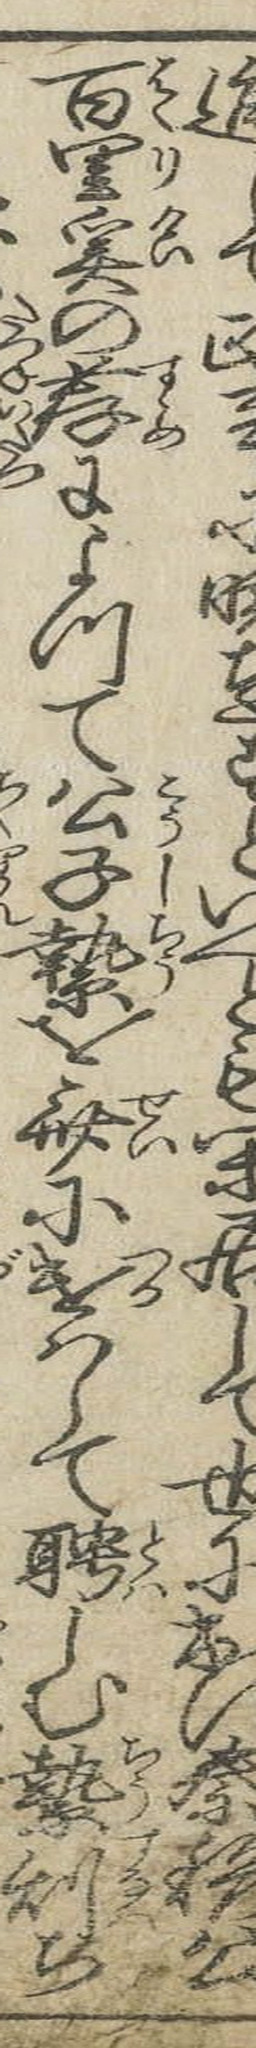百里奚の薦によつて公子縶を斉に遣はして聘しむ縶則ち
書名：絵本写宝袋 9巻 5之巻
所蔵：東京学芸大学教育コンテンツアーカイブ
